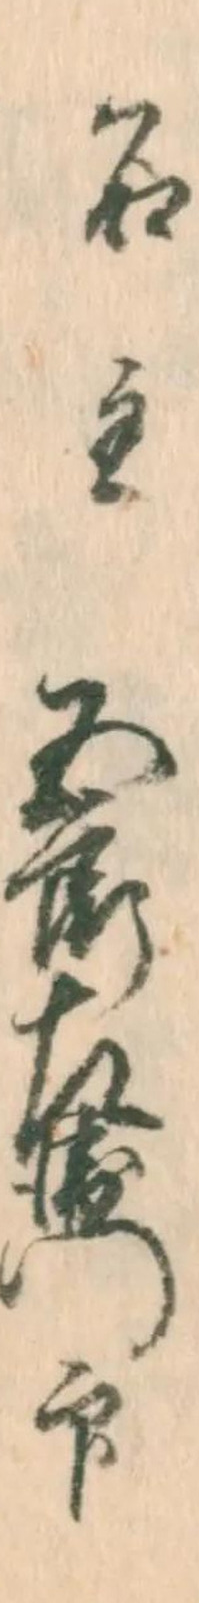名主五郎左衛門印
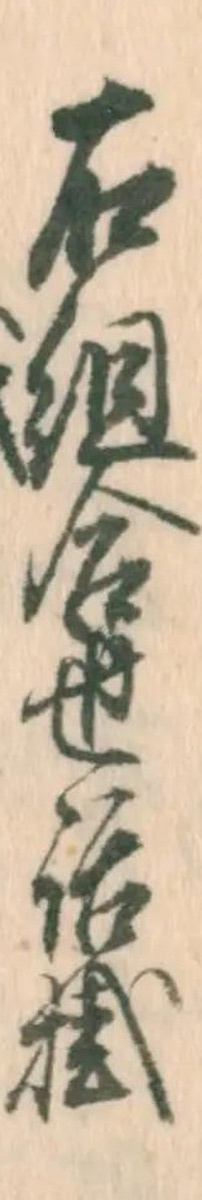右組合世話掛
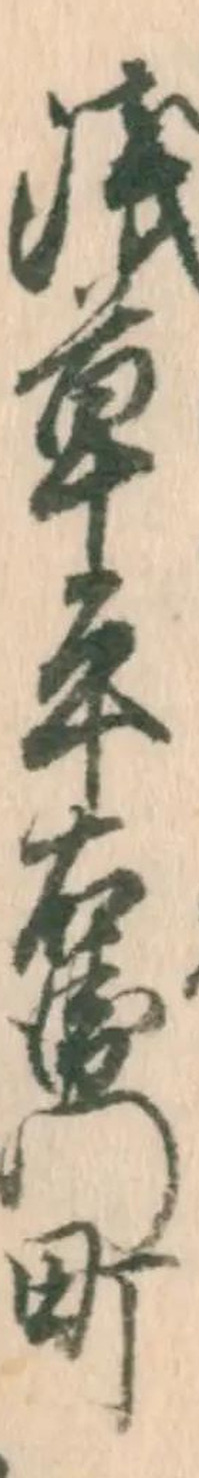浅草平右衛門町
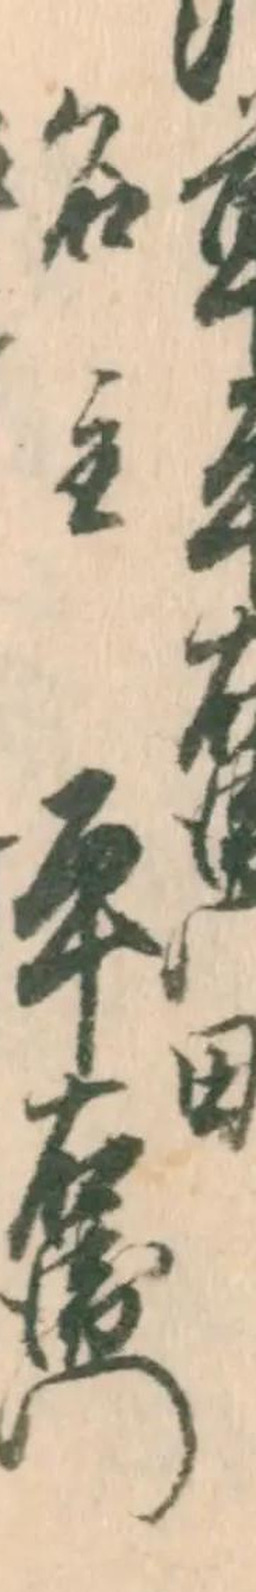名主平右衛門
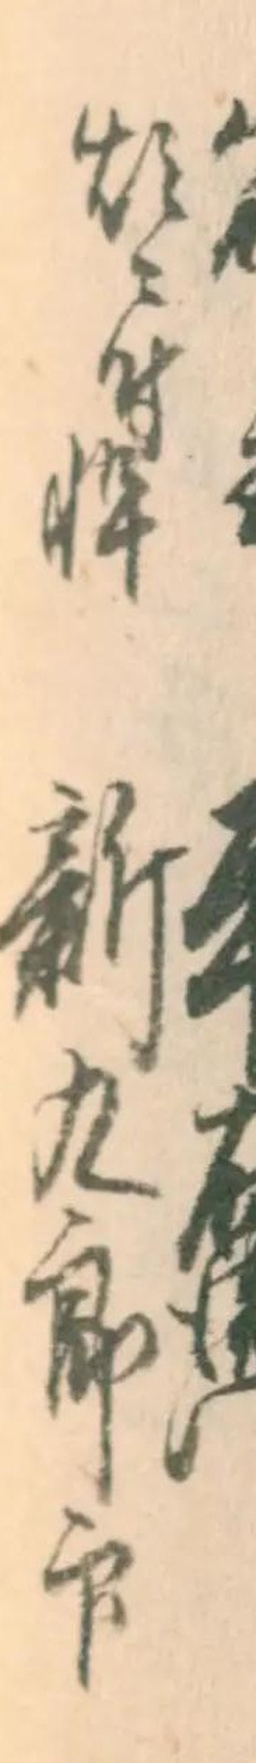煩ニ付倅新九郎印
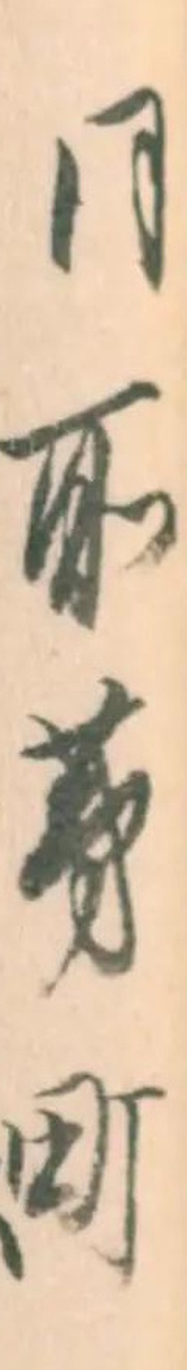同所茅町
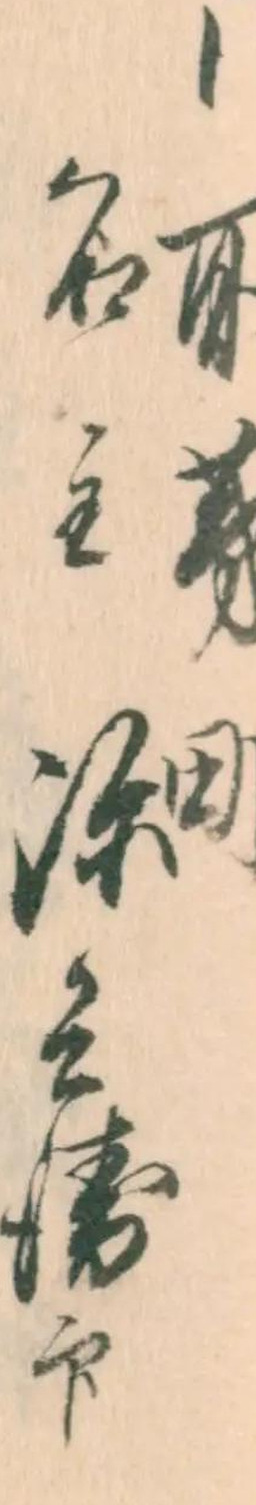名主源兵衛印
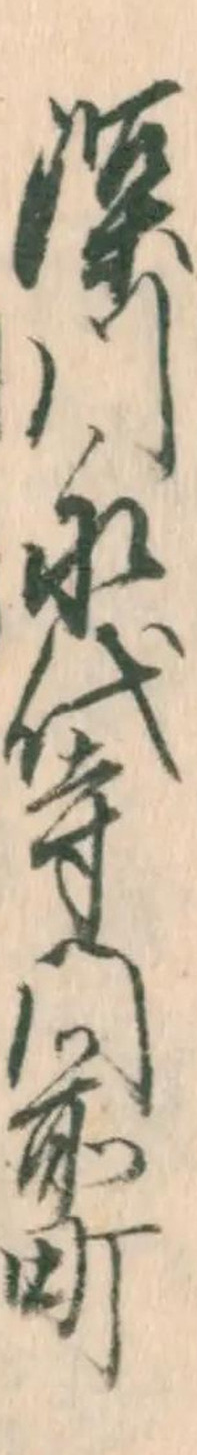深川永代寺門前町
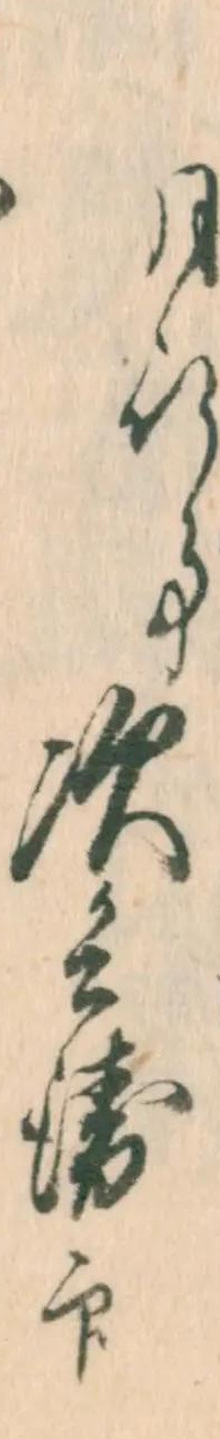月行事次兵衛印
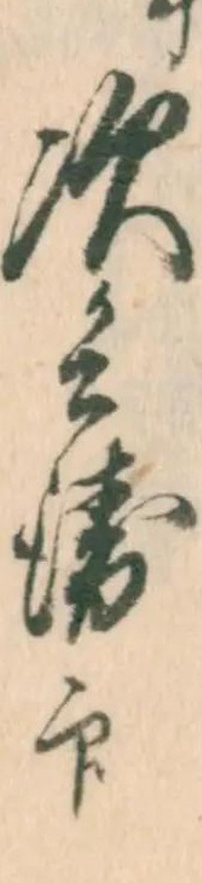月行事次兵衛印
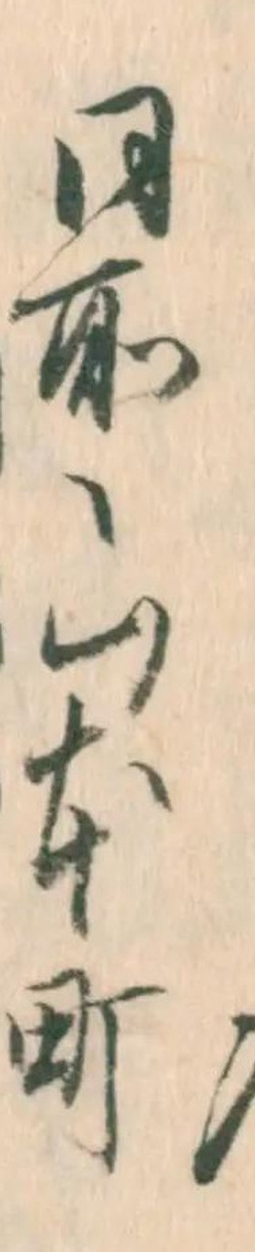同所山本町
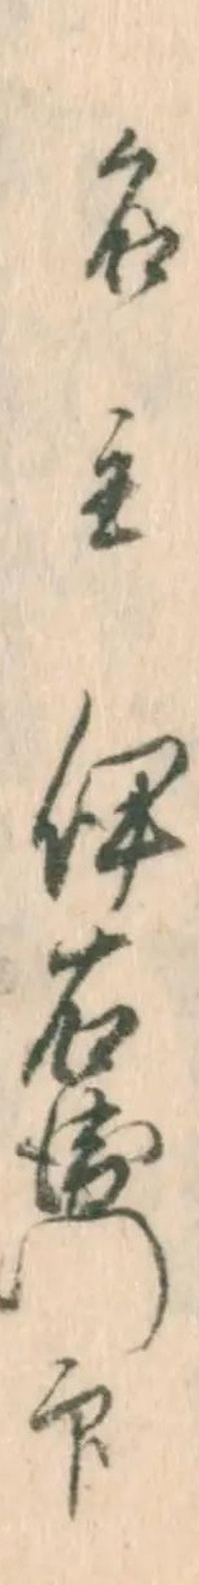名主伊右衛門印
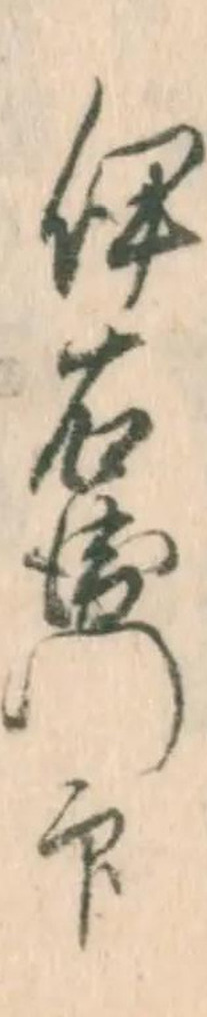月行事吉右衛門印
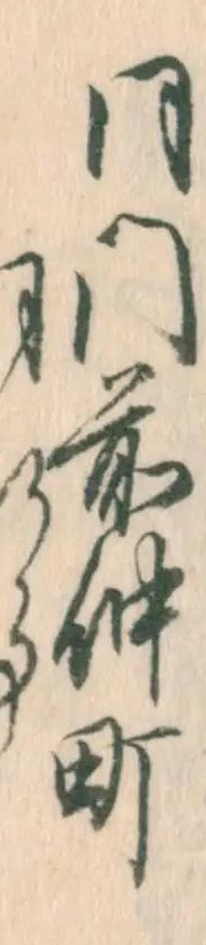同門前仲町
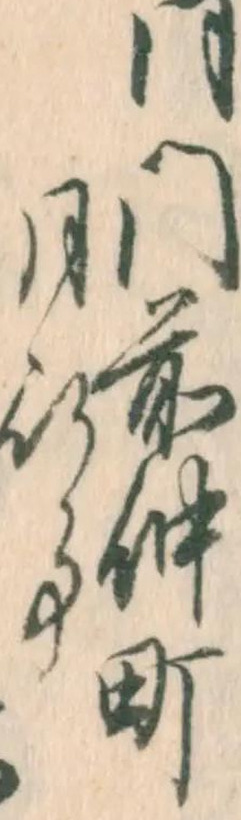同門前仲町
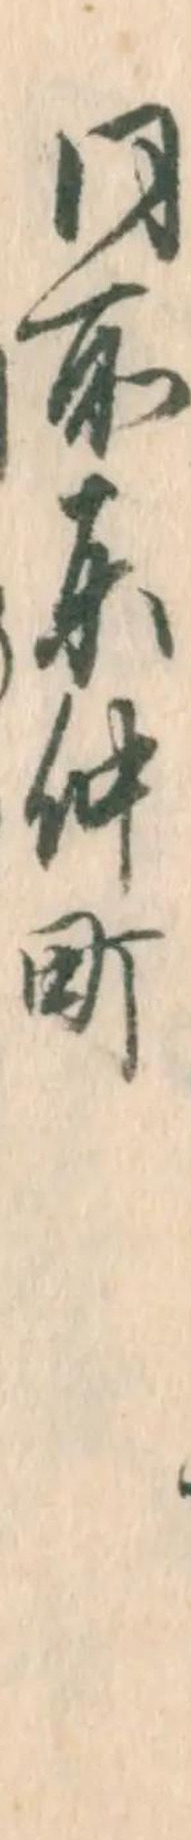同所東仲町
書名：地震災書留 2巻. [2] 内表紙に「地震一件　安政二卯年十月」とあり
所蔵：国立国会図書館 National Diet Library, JAPAN
